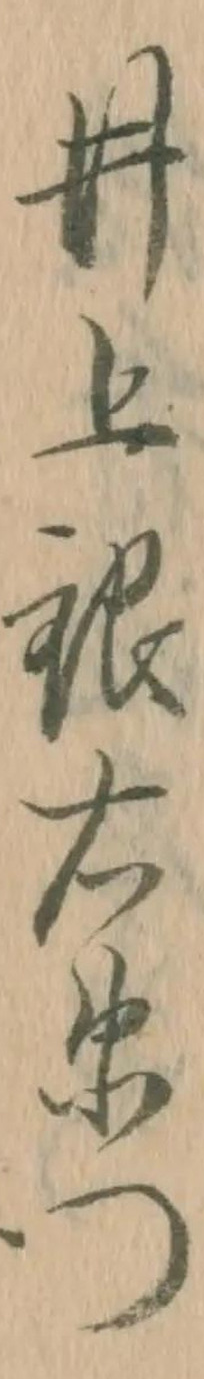井上銀右衛門
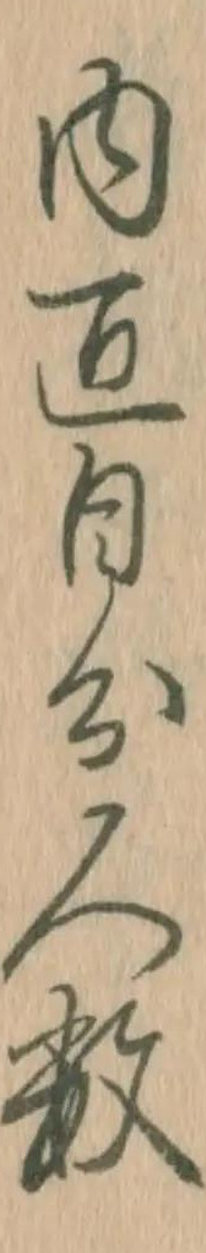内匠自分人数
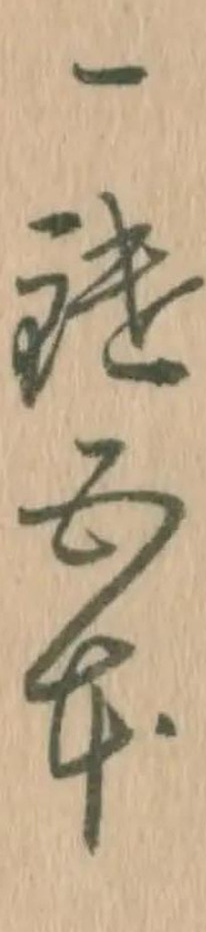一鑓五本
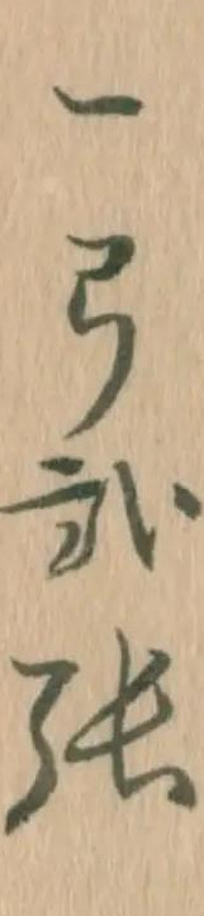一弓弐張
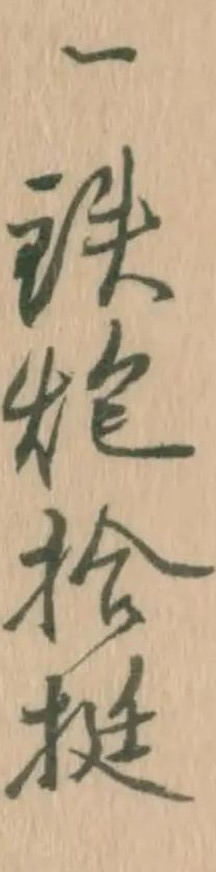一鉄炮拾挺
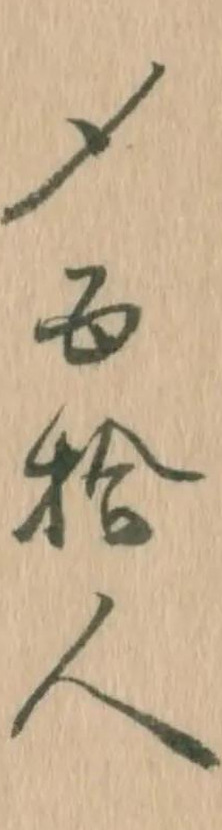〆五拾人
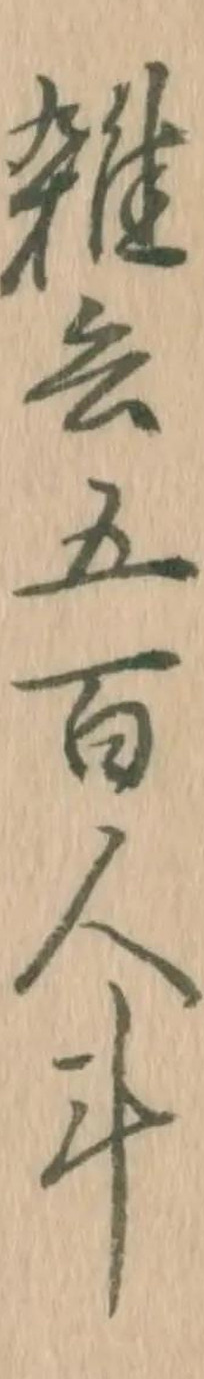雑兵五百人斗
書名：切支丹御退治記 49巻. [4]
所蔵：国立国会図書館 National Diet Library, JAPAN
